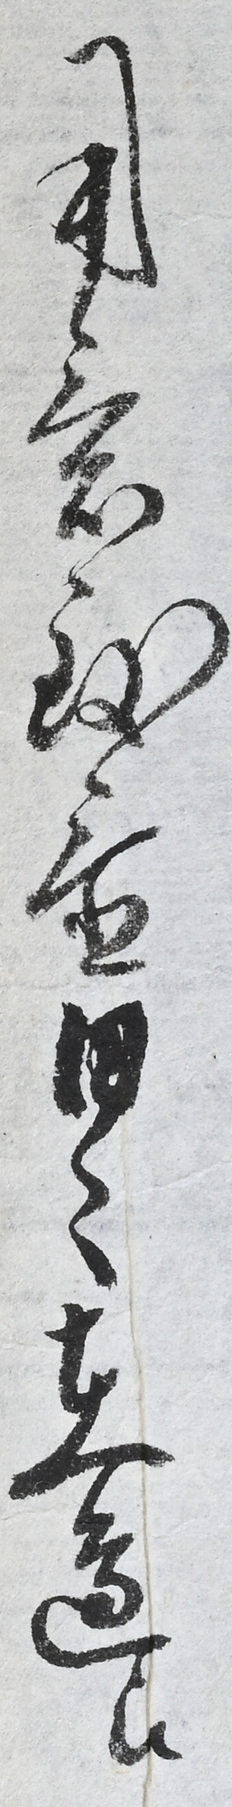用意致置日々在辺え
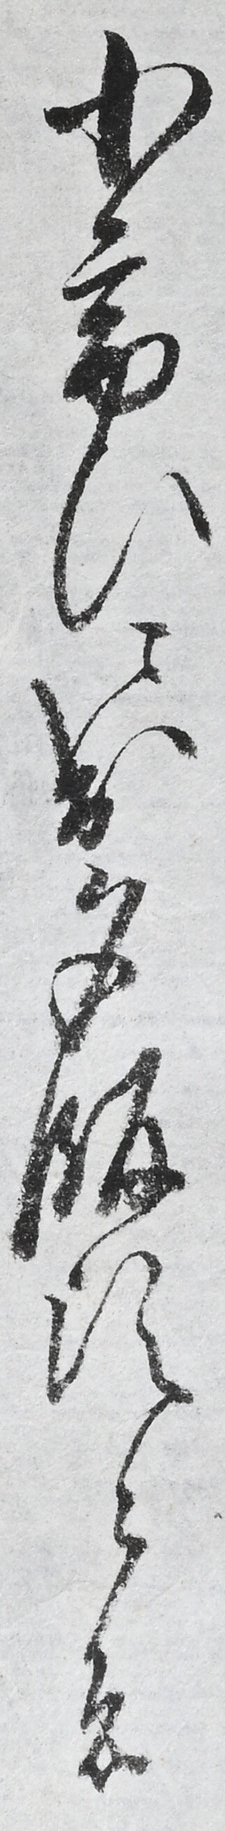小商ひニ出夕飯頃ニは
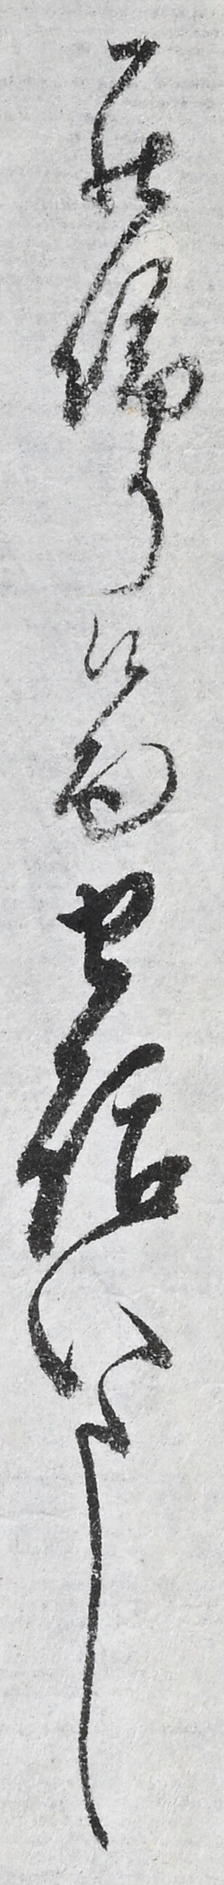罷帰り候而セ話いたし
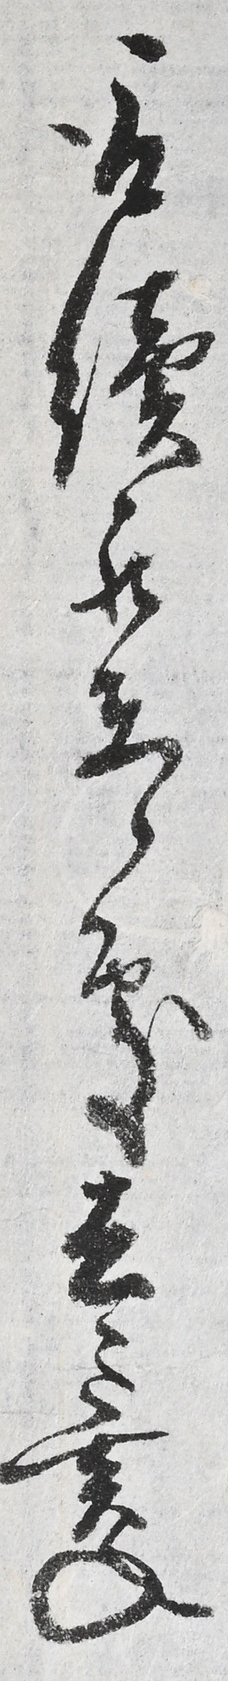取続罷在候処去々亥年
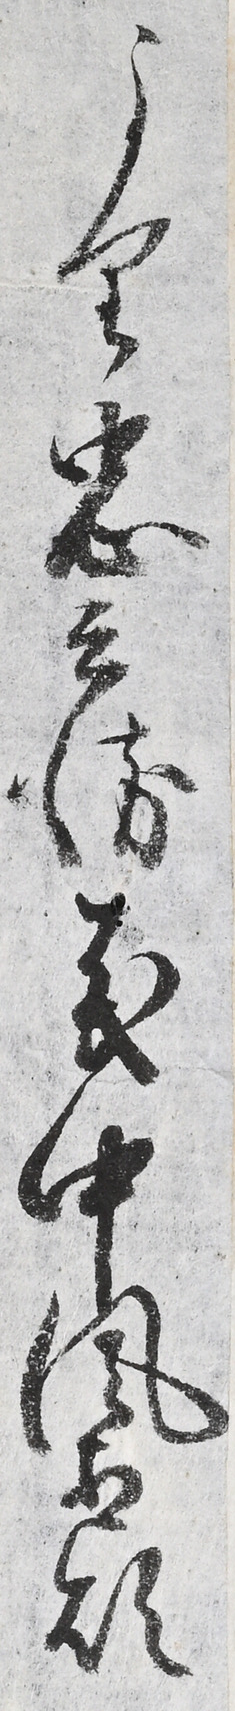より忠兵衛義中風相煩
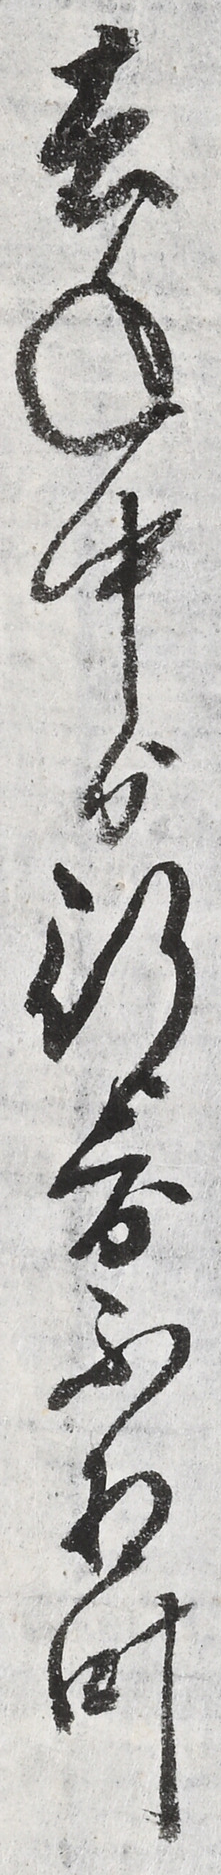去年中より行歩不相叶
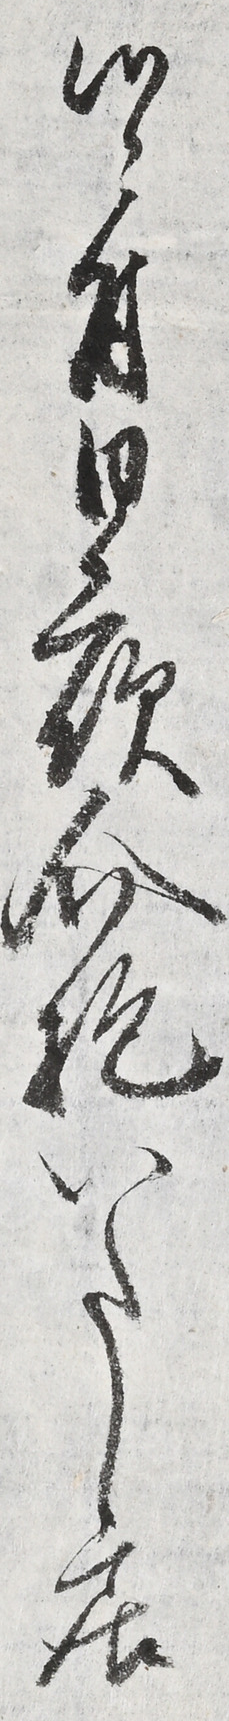候ニ付日夜介抱いたし居
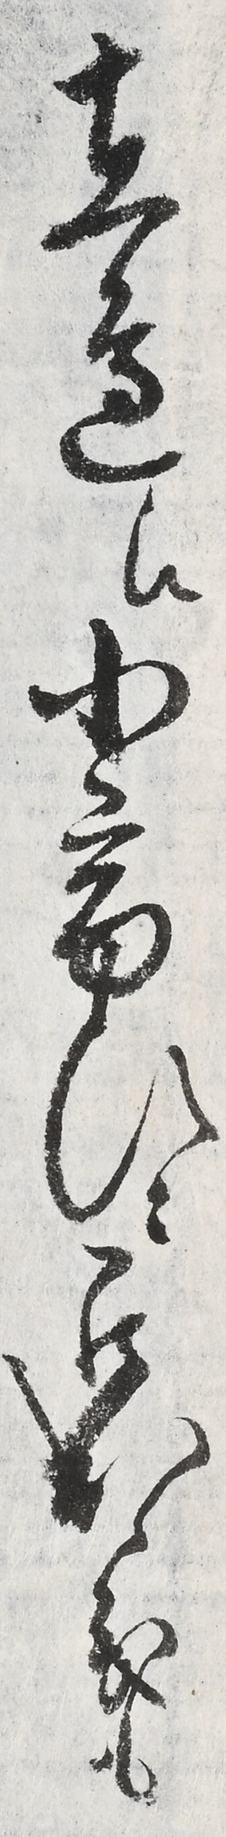在辺え小商ひニ被出候義も
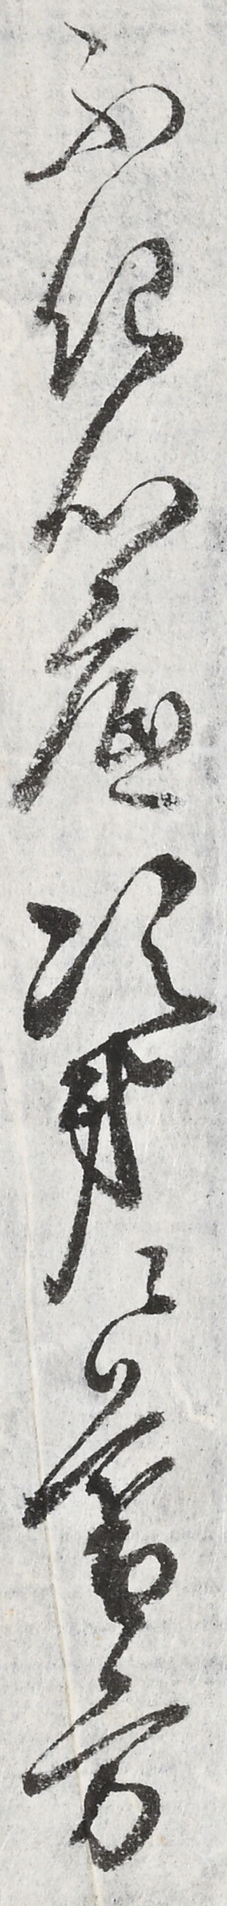不任心底次第ニ暮方
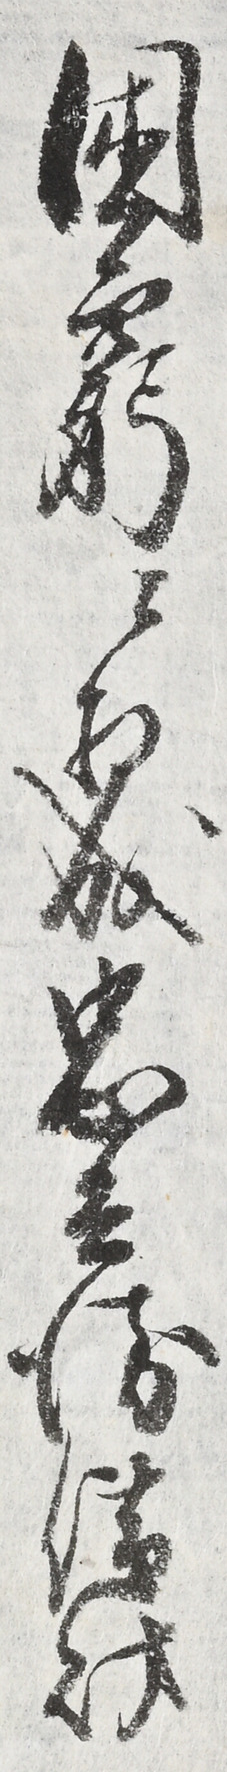困窮ニ相成忠兵衛借財
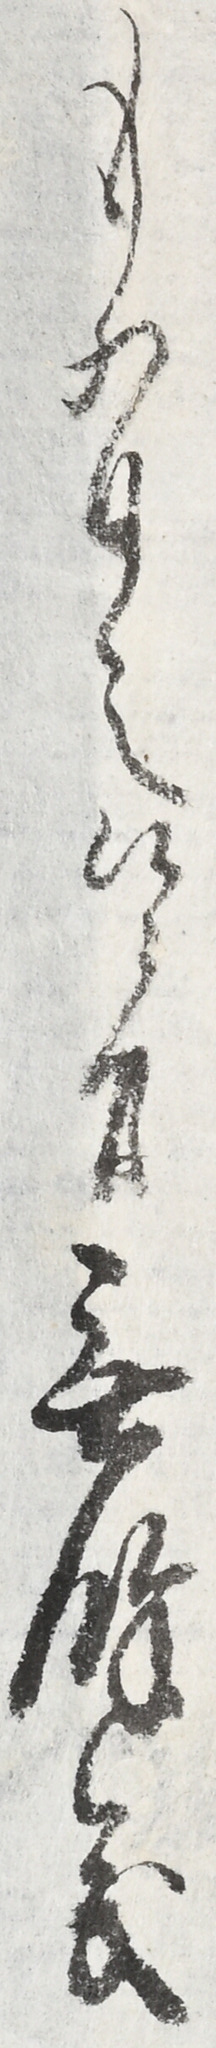も有之候ニ付無余義

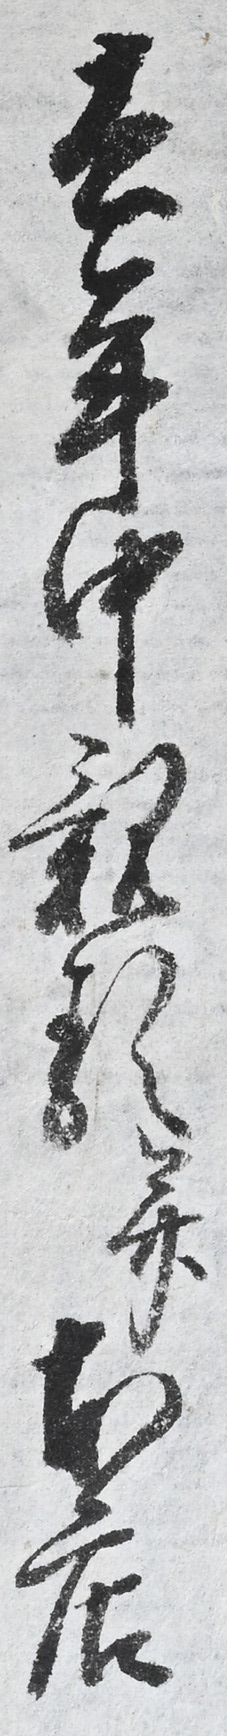去年中親類幷本店
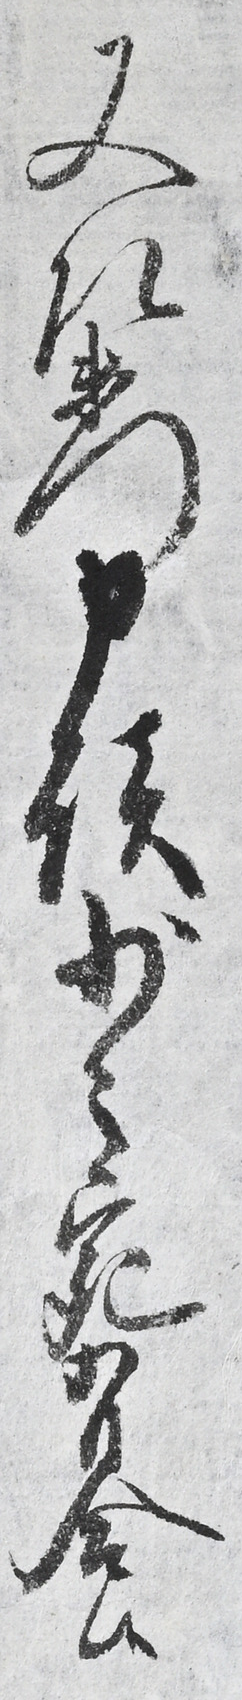又左衛門申請少々宛有合候
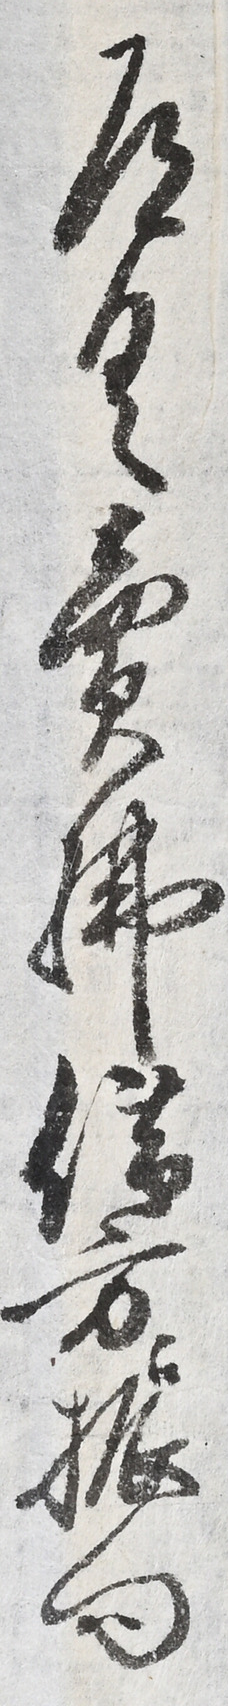道具売払借方え振向
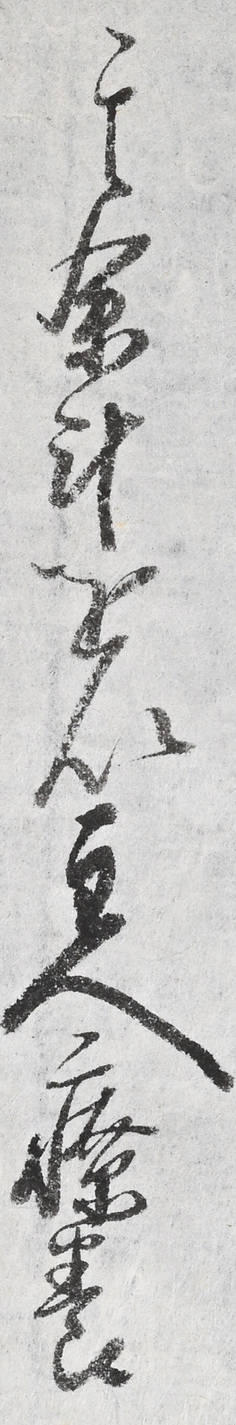其余計を以主人療養
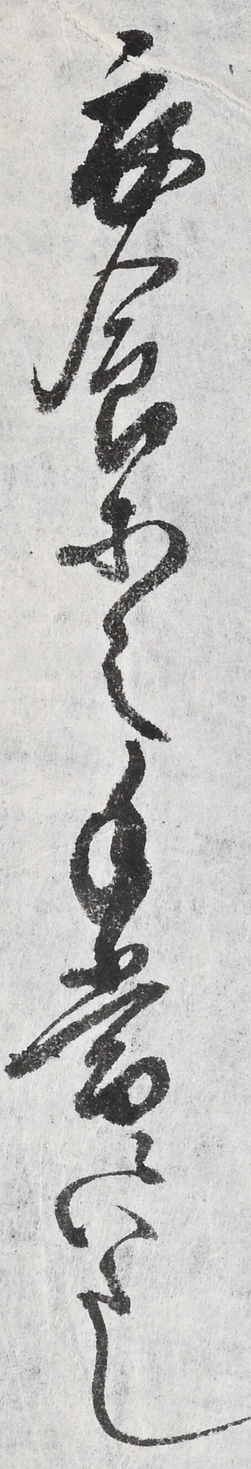衣食等之手当ニいたし
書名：（書付）
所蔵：伊那市立高遠町図書館・合同会社AMANE
